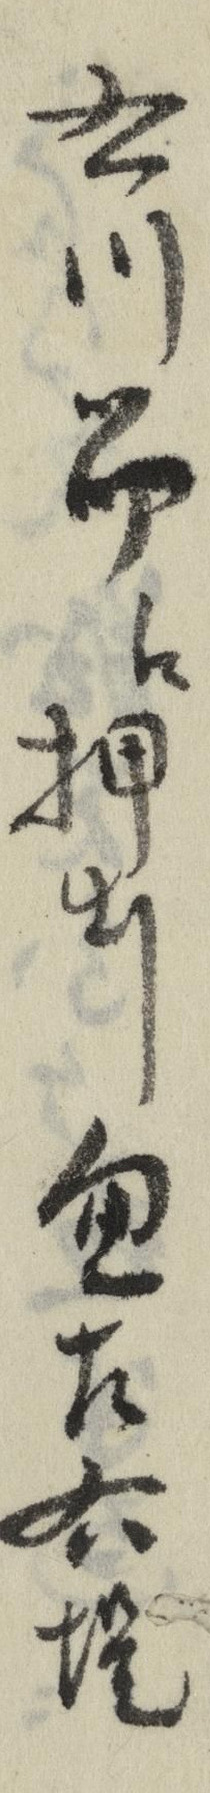右川筋江押出し忽左右堤
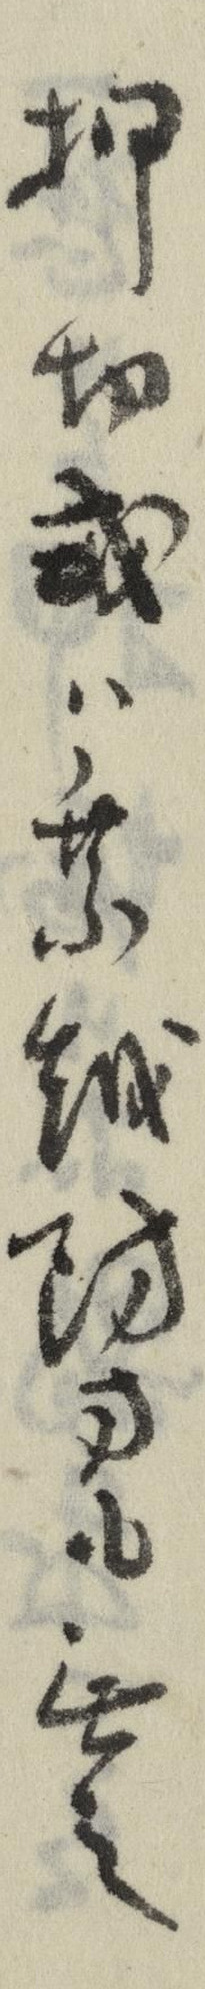押切或ハ乗越防方も無之
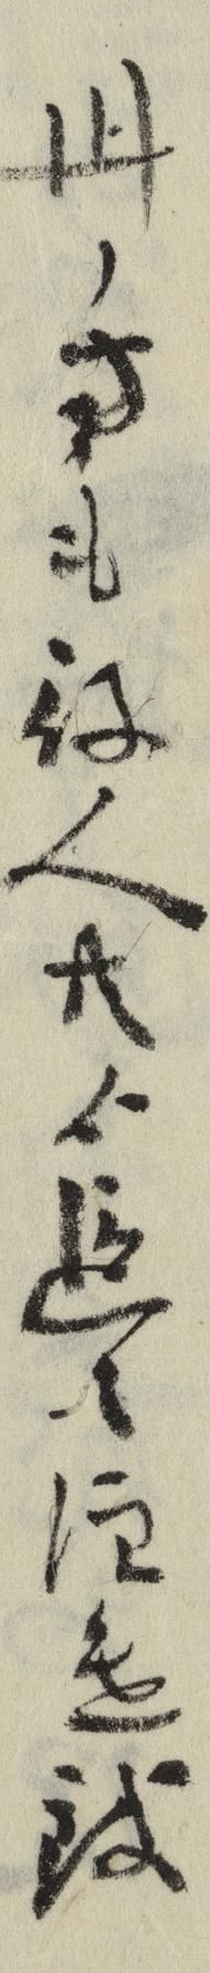川ノ方役人共ゟ追々注進致
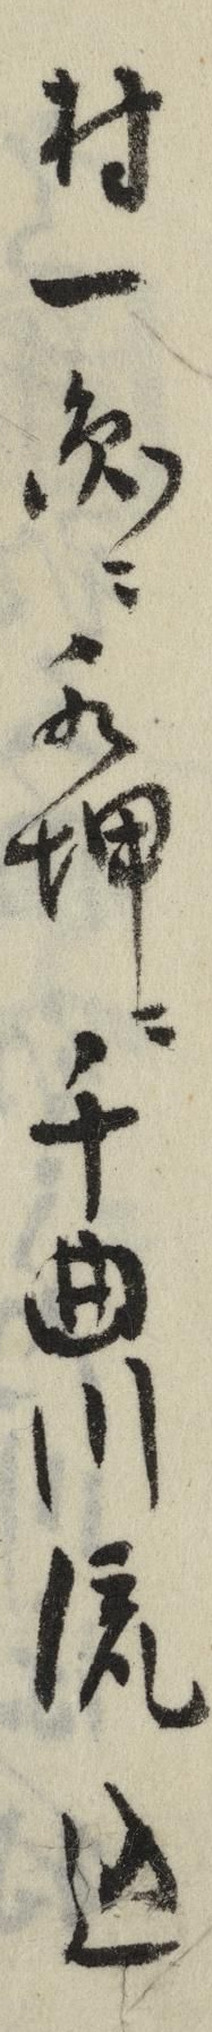村一円二水押二千曲川流込
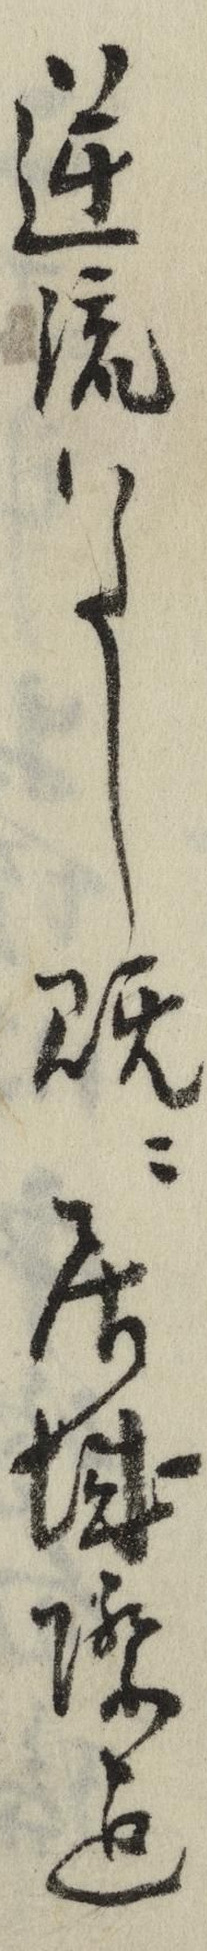逆流いたし既二居城際迄
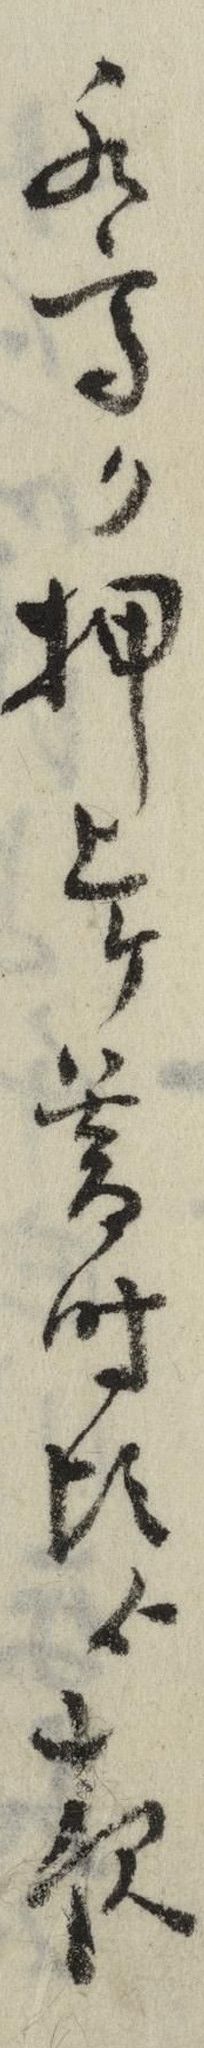水高ク押上ケ暮時頃ゟ夜

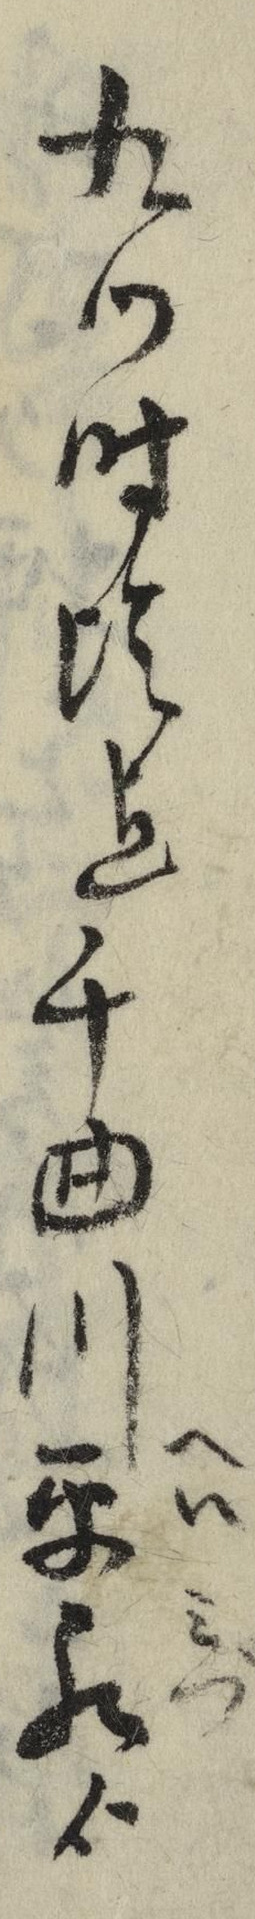九ッ時比迄千曲川平水ゟ
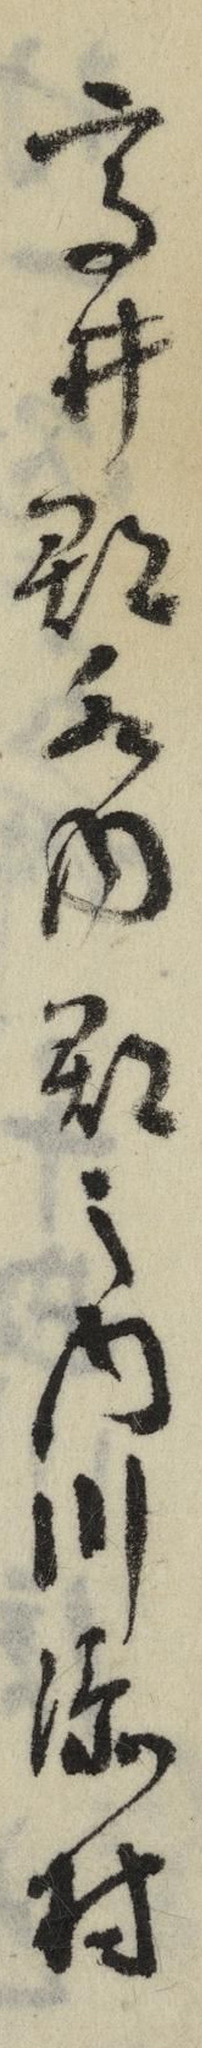高井郡水内郡之内川添
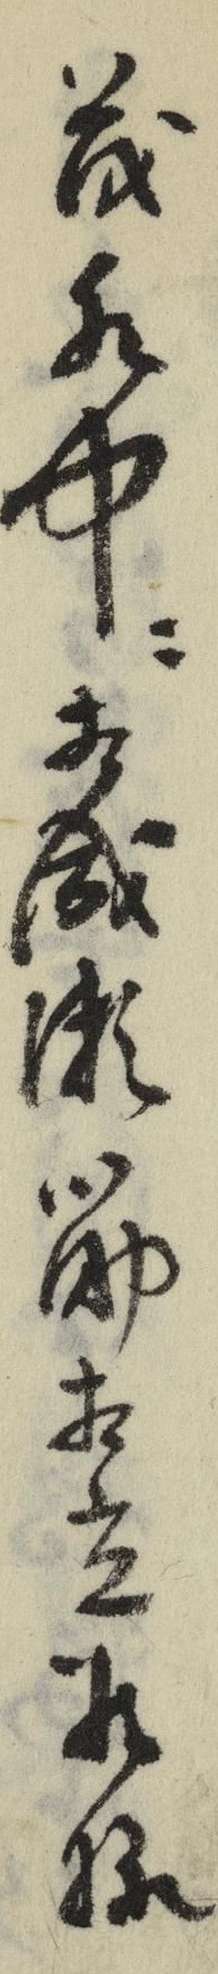も水中二相成瀬筋相立候様
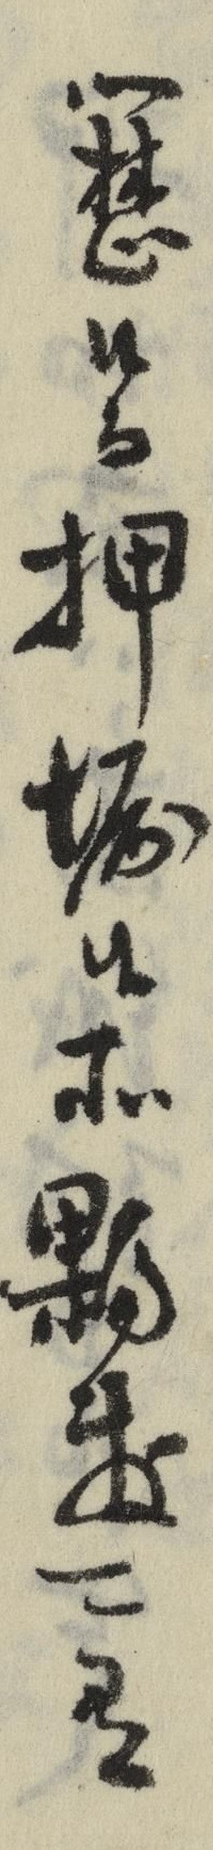暦候而押堀候所夥敷可有
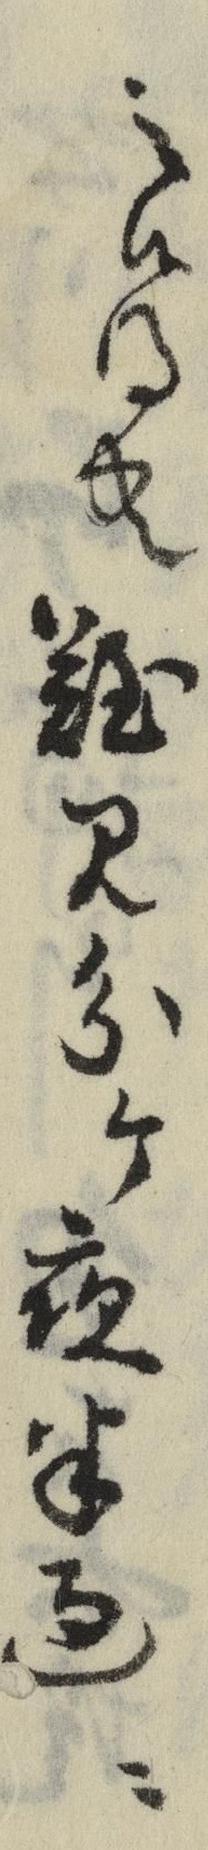之候得共難見分夜半過二
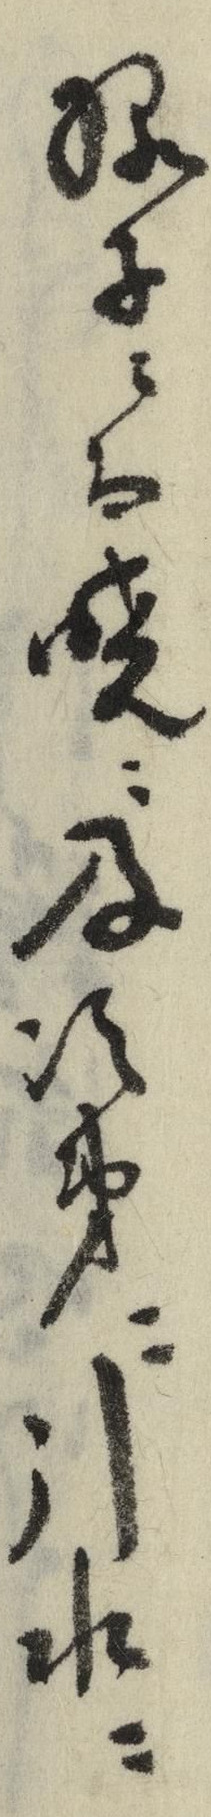様子二而暁二及次第二引水二
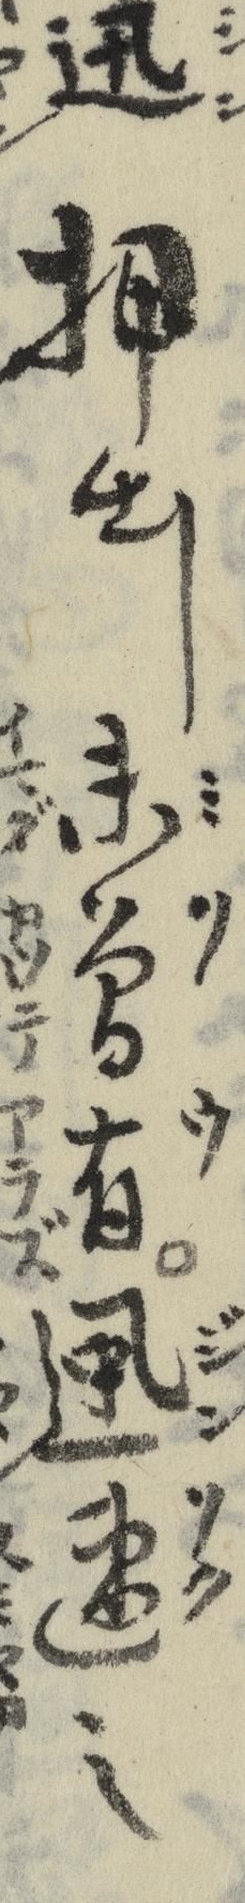迅押出し未曾有迅速之
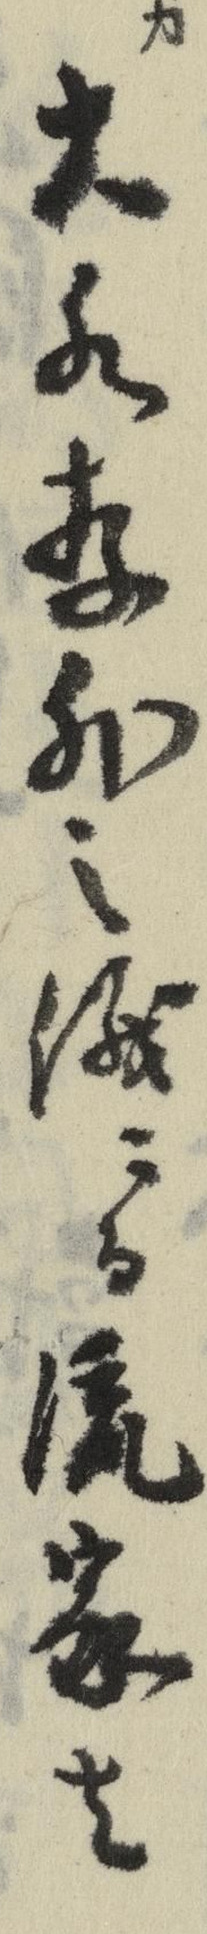大水存外之儀二而流家者
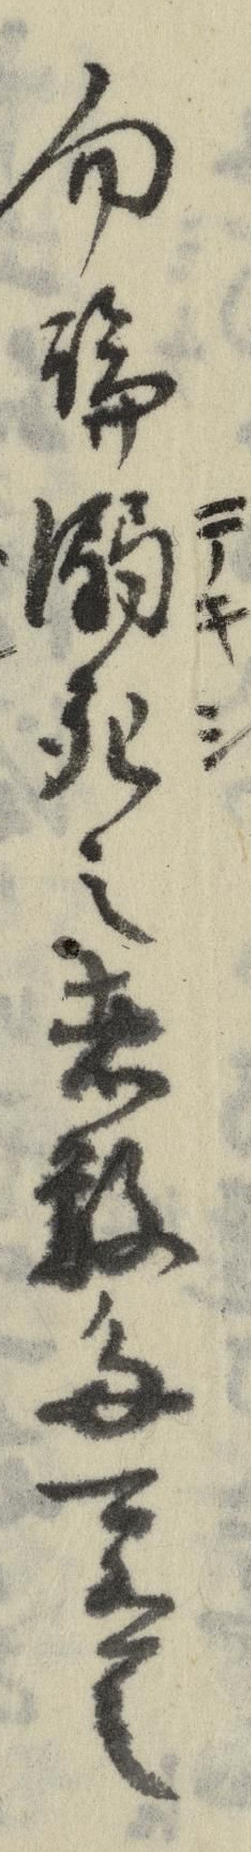勿論溺死之者数多可有之
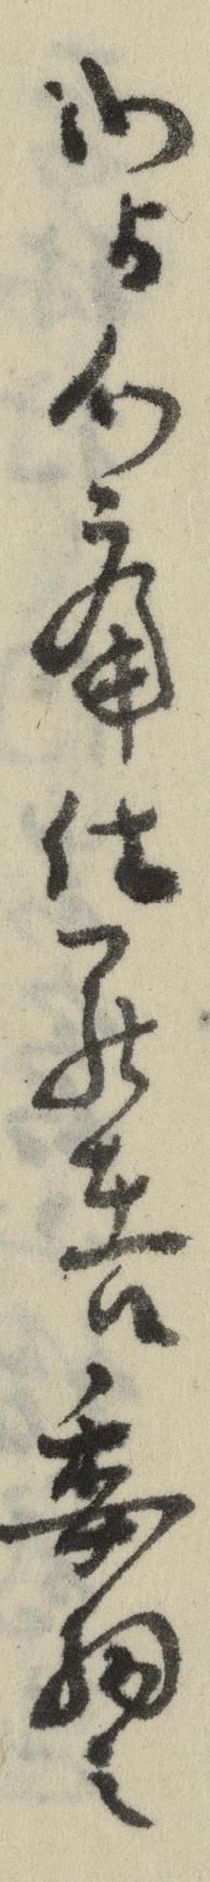哉と心痛仕罷在候委細之
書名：信州大地震一件之冩　丁未弘化四年三月吉日
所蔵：東京大学地震研究所図書室 Earthquake Research Institute Library, The University of Tokyo, JAPAN
